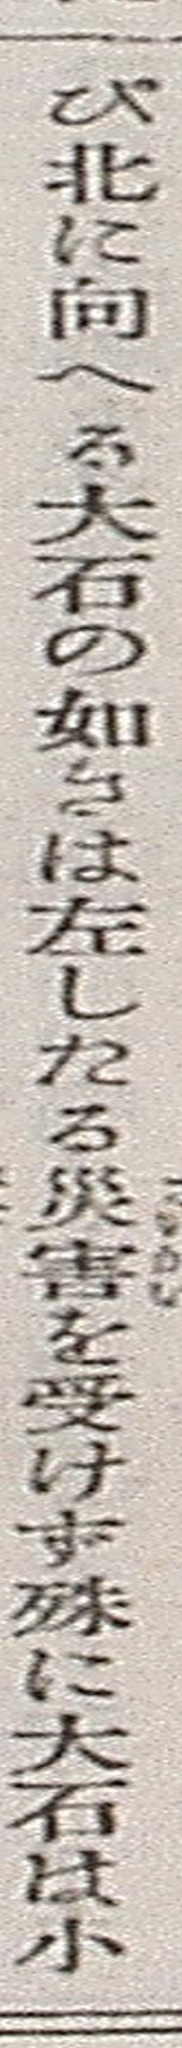び北に向へる大石の如きは左したる災害を受けず殊に大石は小
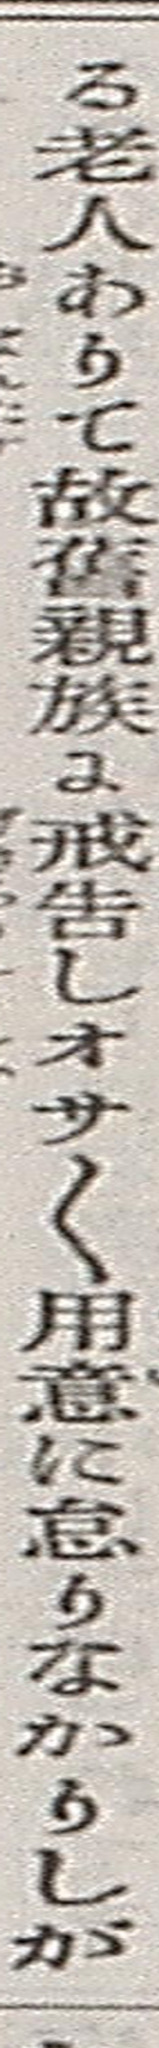る老人ありて故旧親族に戒告しオサ〳〵用意に怠りなかりしが
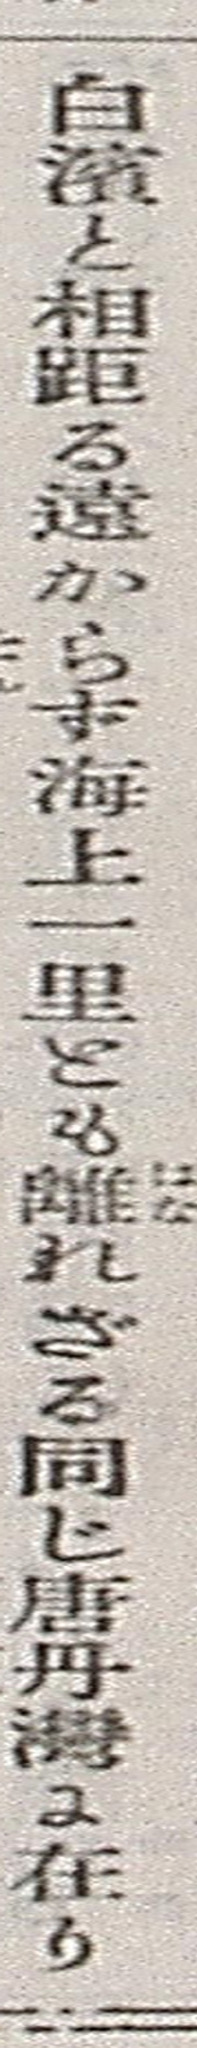白浜と相距る遠からず海上一里とも離れざる同じ唐丹湾に在り
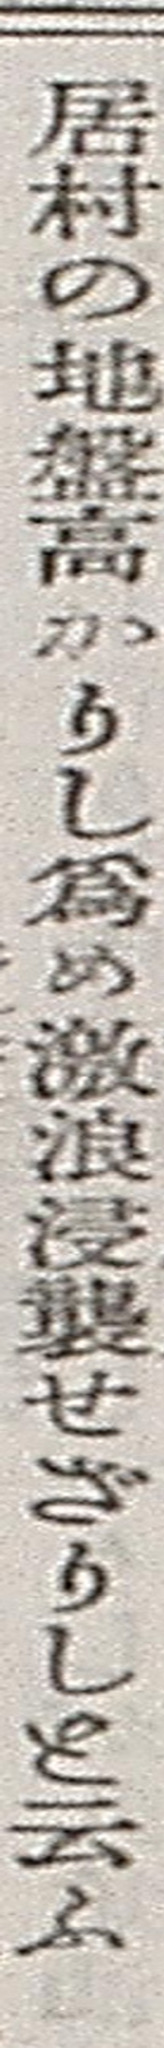居村の地盤高かりし為め激浪浸襲せざりしと云ふ
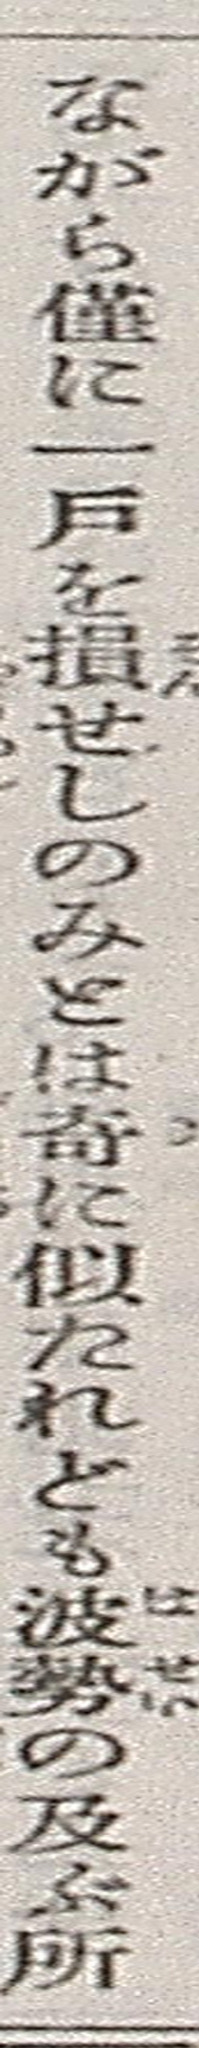ながら僅に一戸を損せしのみとは奇に似たれども波勢の及ぶ所
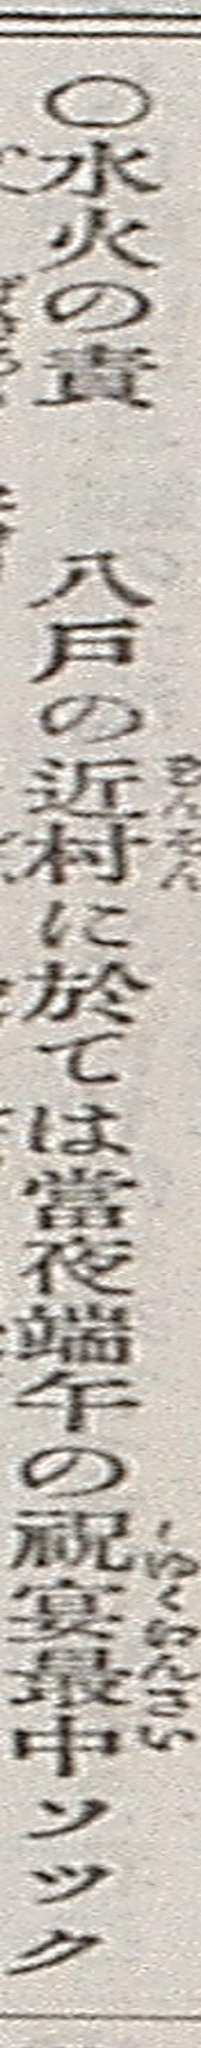○水火の責八戸の近村に於ては当夜端午の祝宴最中ソック
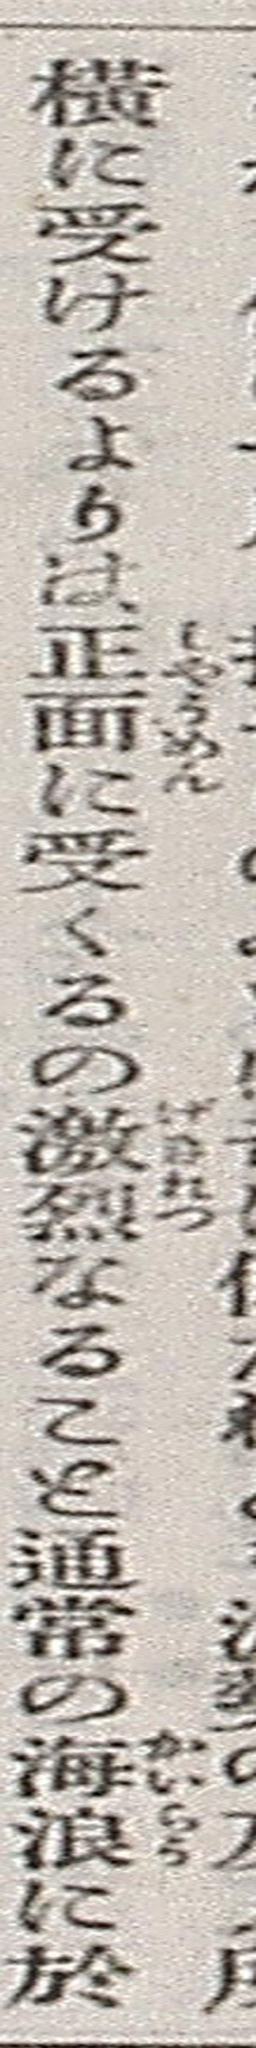横に受けるよりは正面に受くるの激烈なること通常の海浪に於
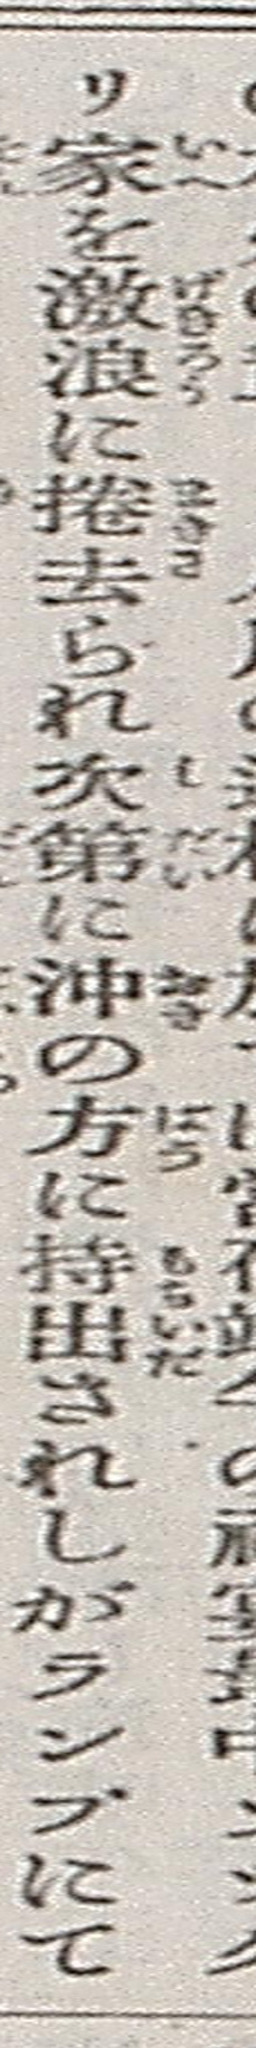リ家を激浪に捲去られ次第に沖の方に持出されしがランプにて
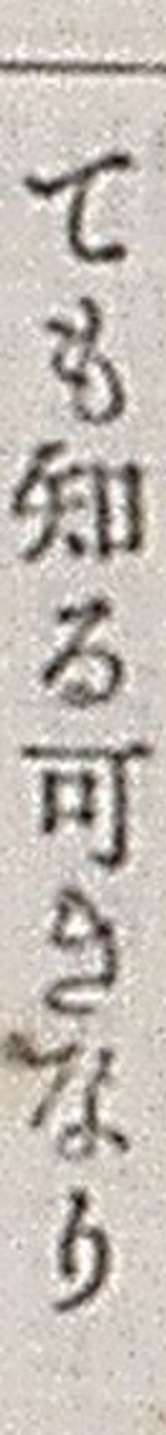ても知る可きなり
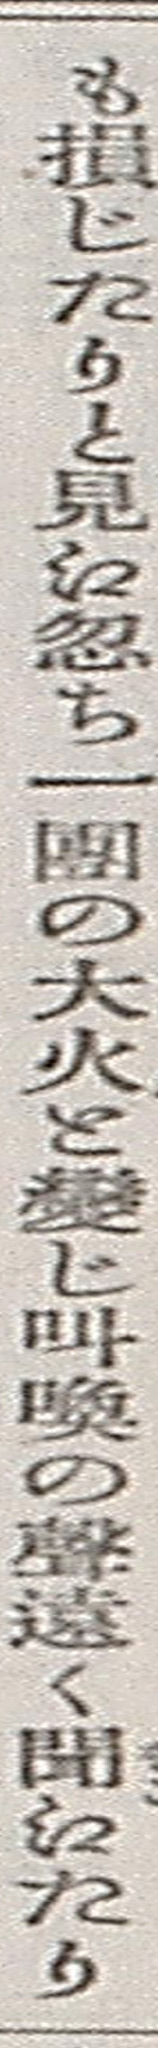も損じたりと見え忽ち一団の大火と変じ叫喚の声遠く聞えたり
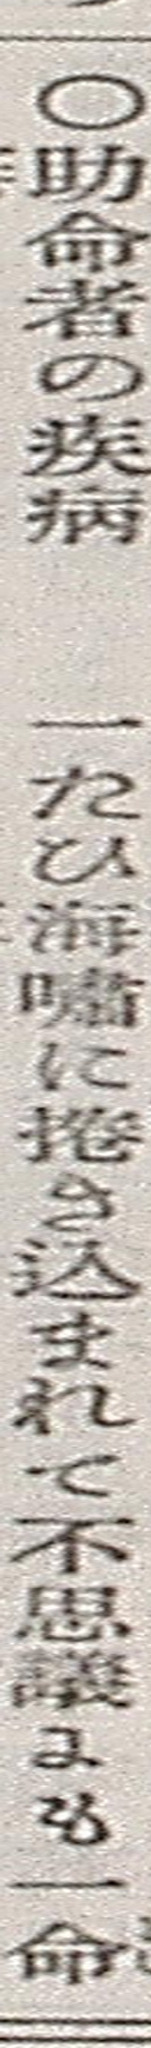○助命者の疾病一たひ海嘯に捲き込まれて不思議にも一命
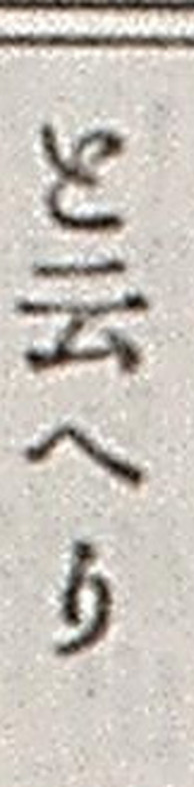と云へり
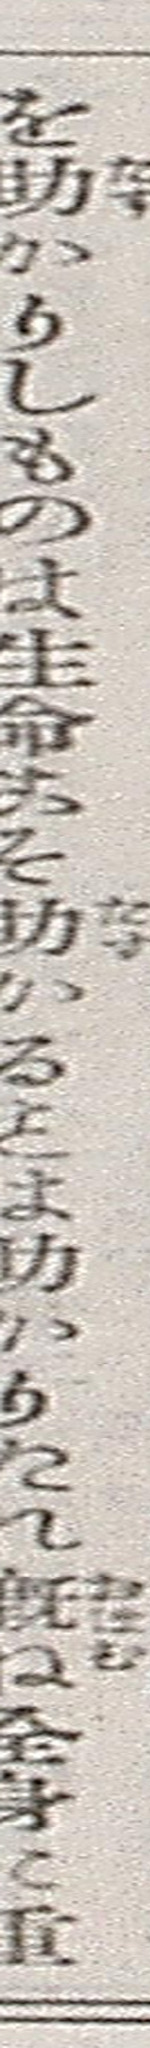を助かりしものは生命こそ助かることは助かりたれ概ね全身に重
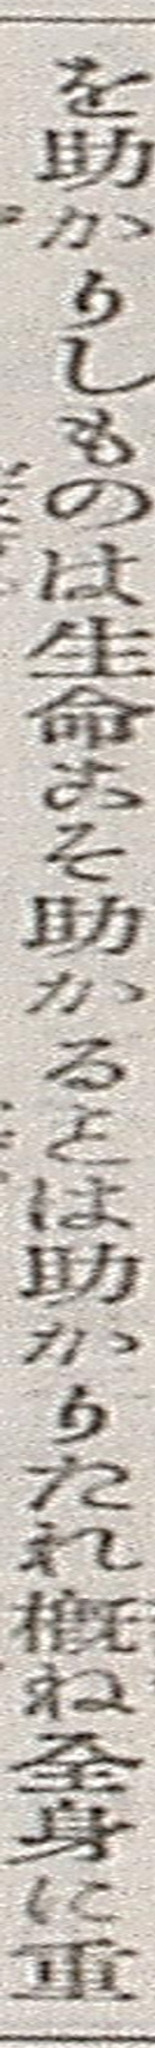を助かりしものは生命こそ助かることは助かりたれ概ね全身に重
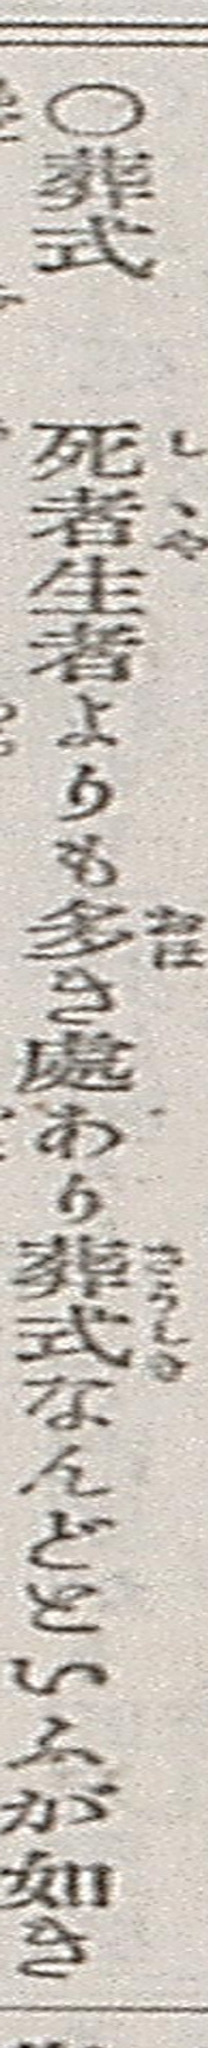○葬式死者生者よりも多き処あり葬式なんどといふが如き
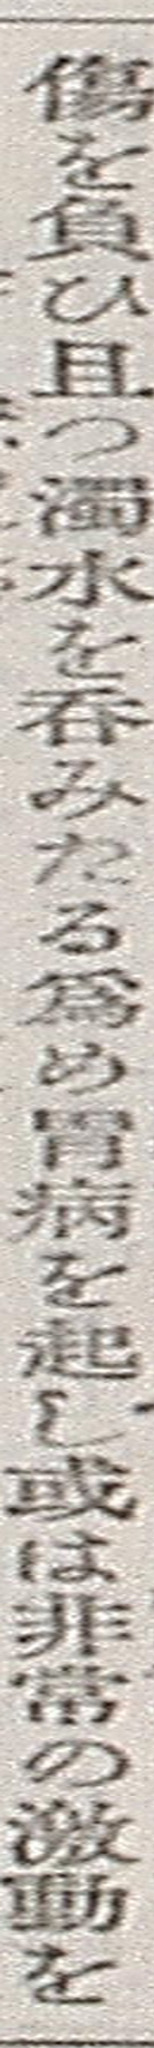傷を負ひ且つ濁水を呑みたる為め胃病を起し或は非常の激動を
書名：風俗畫報臨時増刊第百二十號　大海嘯被害録（下）
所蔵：東京大学地震研究所図書室 Earthquake Research Institute Library, The University of Tokyo, JAPAN
